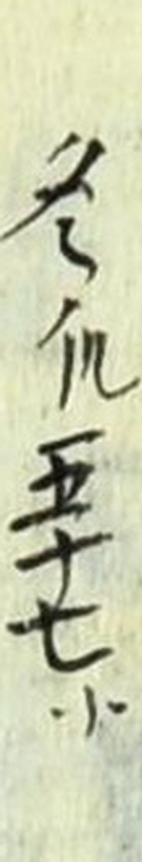「冬瓜五十七小
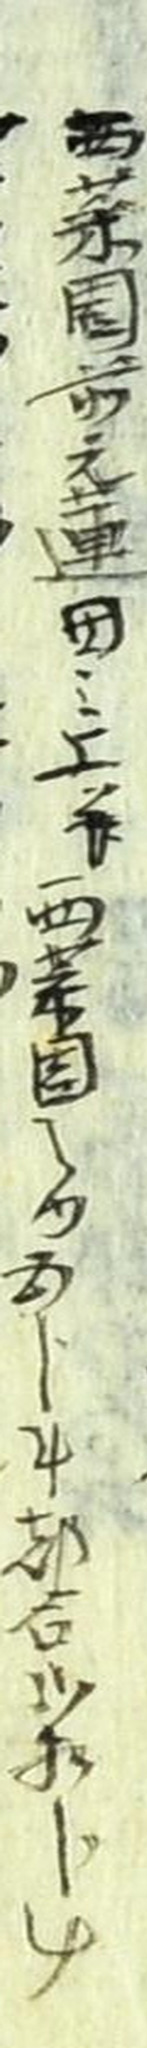西菜園前之蓮田之上幷西菜園之内五歩計都合弐拾歩計
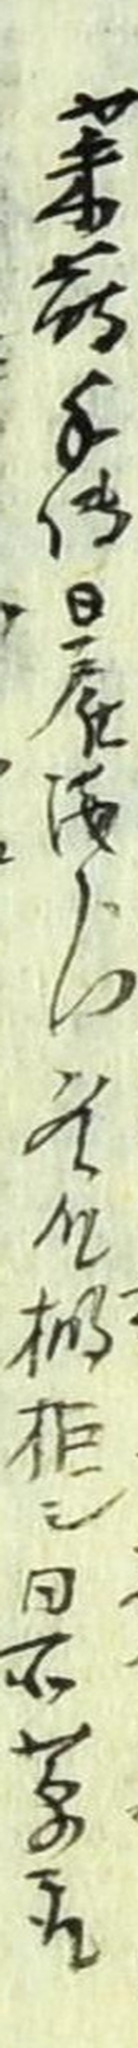菜蒔手伝日雇浅右衛門冬瓜棚拒シ同所草取
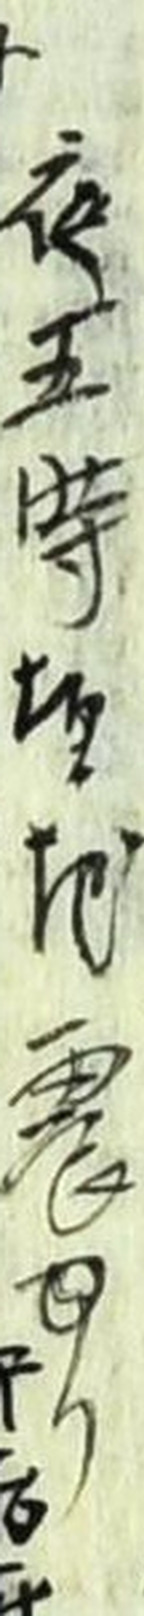夜五時頃地震ゆり
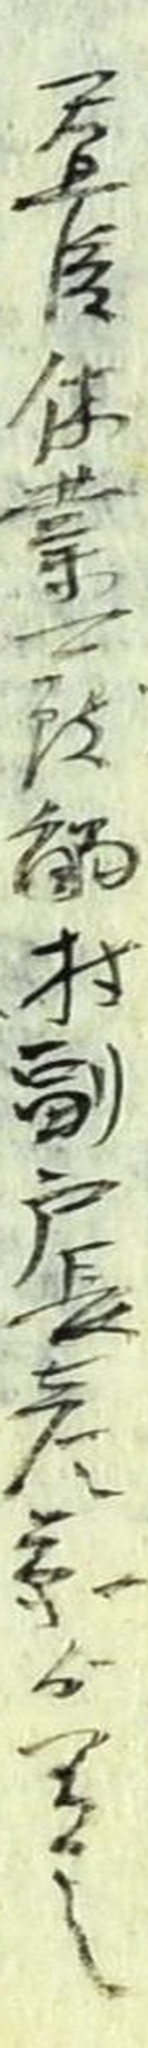昼後休業可致触村副戸長彦兵衛ゟ有之
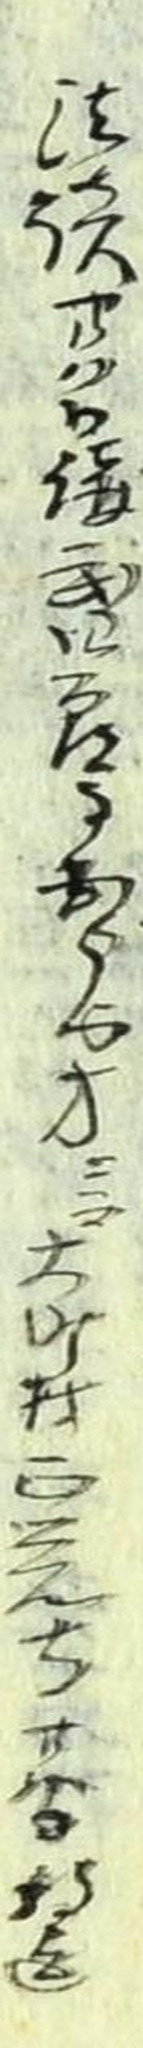法談廿八日講武四郎方五郎右衛門方ニ而大町村正覚寺廿八日朝迄
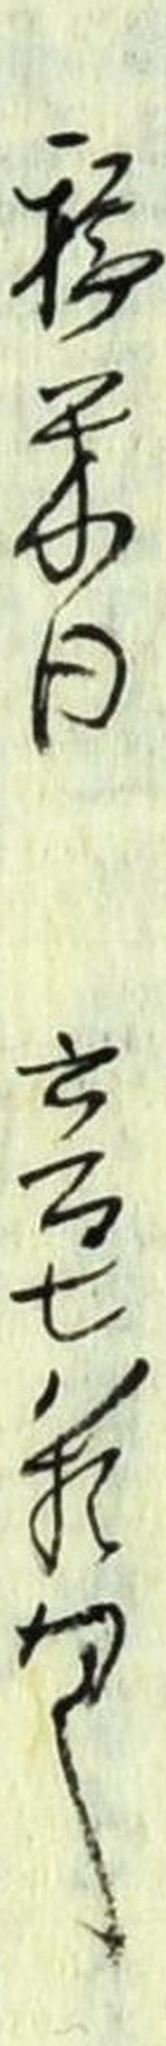糯米同六百七八拾匁
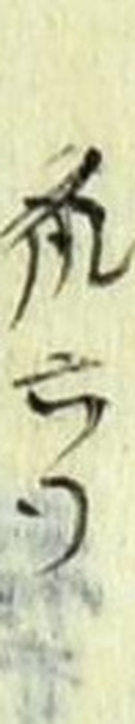瓜六ツ
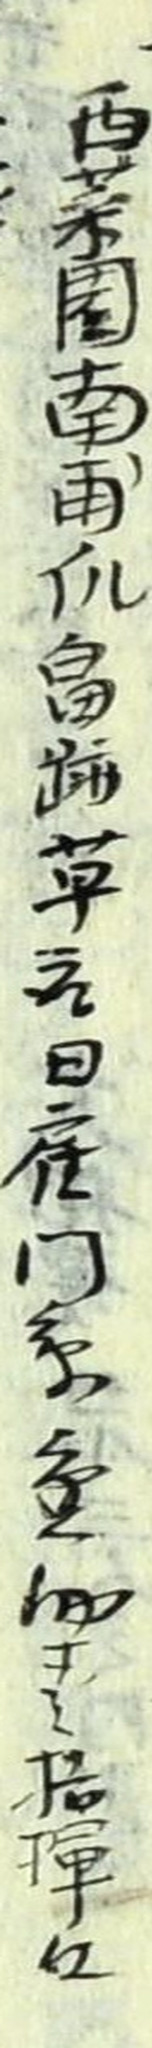西菜園南甫瓜畠跡草取日雇門兵衛金助等之指揮仕
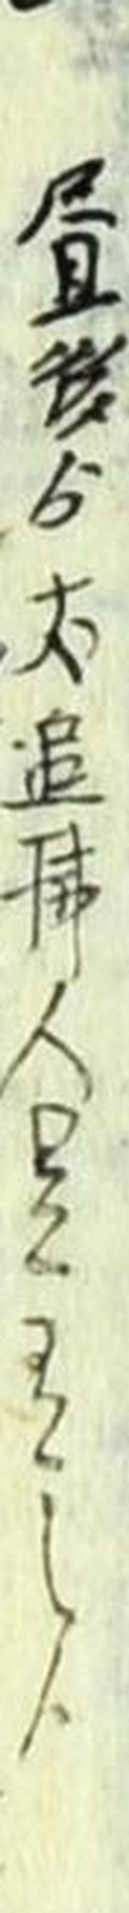昼後ゟ犬追払人足有之候
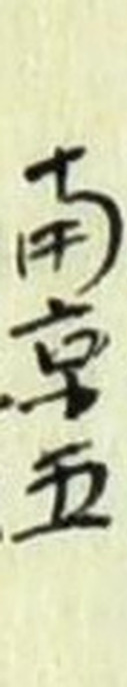南京五
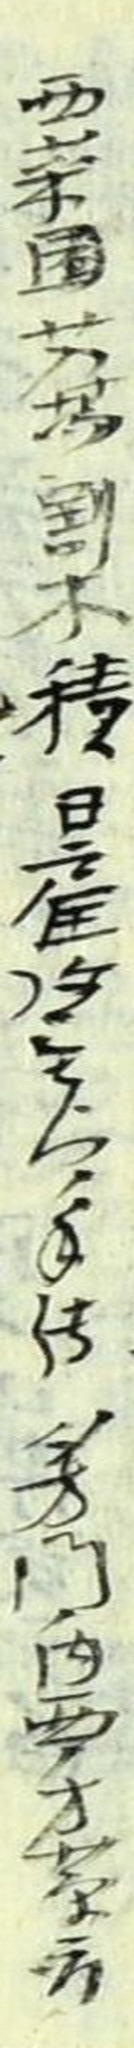西菜園艾場割木積日雇弥三右衛門手伝夕方門ノ内西ノ方草取
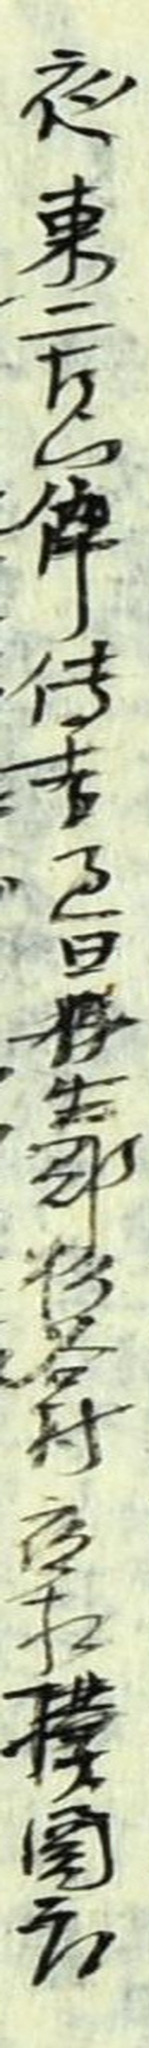夜東二左衛門倅伝吉過日丹生郡杉谷村夜相撲関取
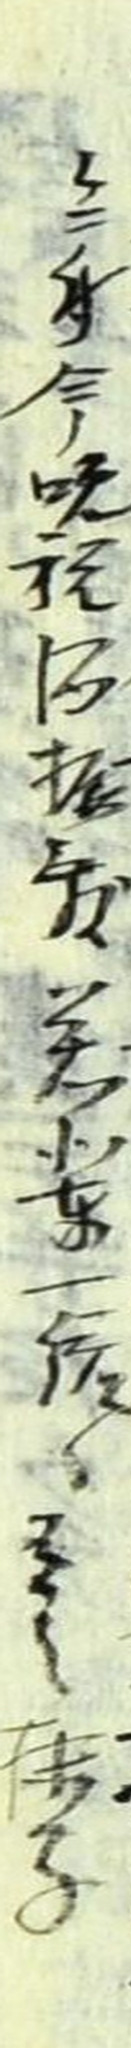候ニ付今晩祝酒振舞若輩一統へ有之様子
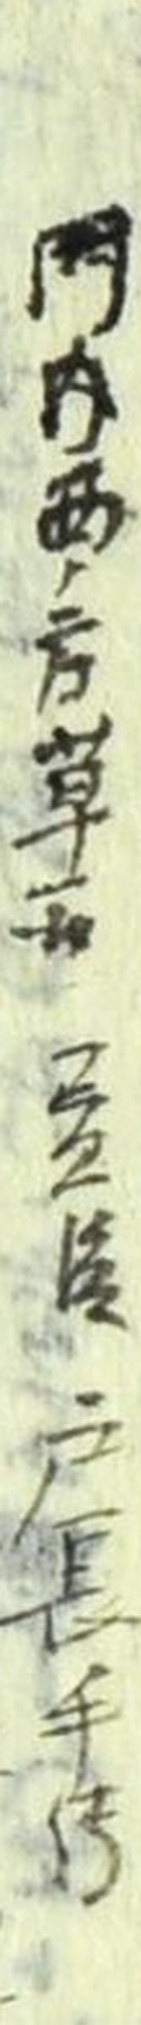門内西ノ方草取昼後戸長手伝

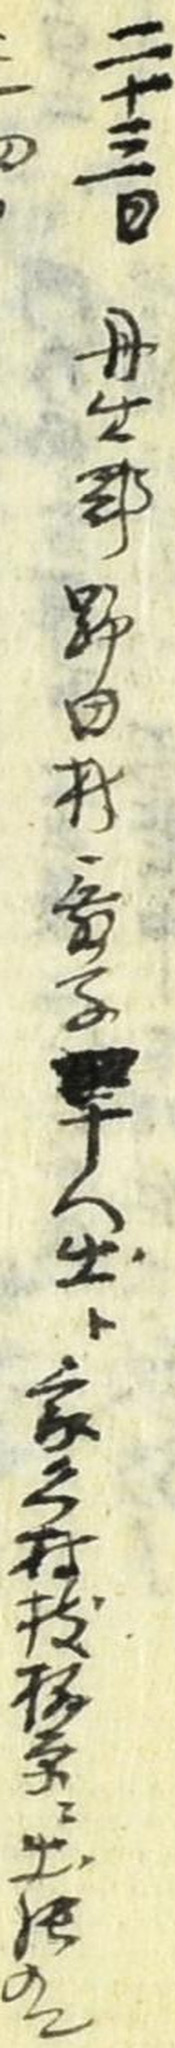二十三日丹生郡野田村舞子四十人出ト家久村枝柳原ニ出張有
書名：（日記）
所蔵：福井県文書館 Fukui Prefectural Archives
